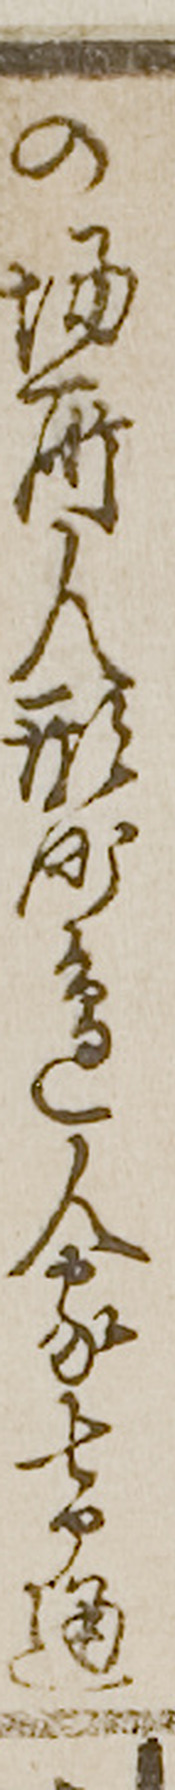の場所人形町辺人家七部通
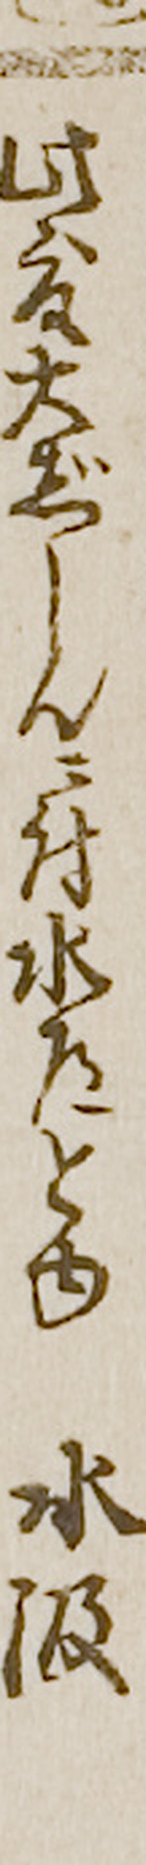此度大じしんに付水道とゆ
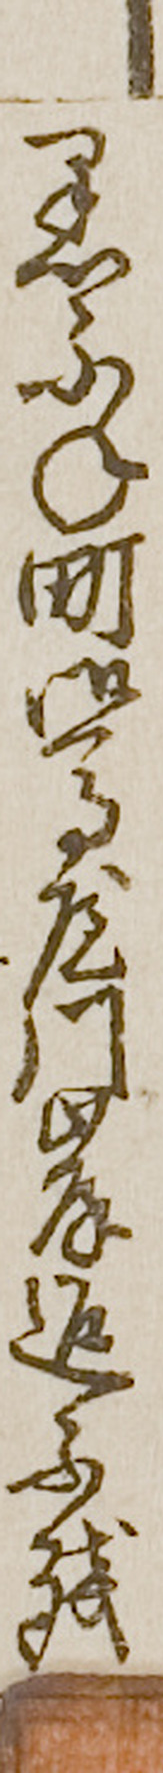黒ふね町御馬屋川岸迠不残
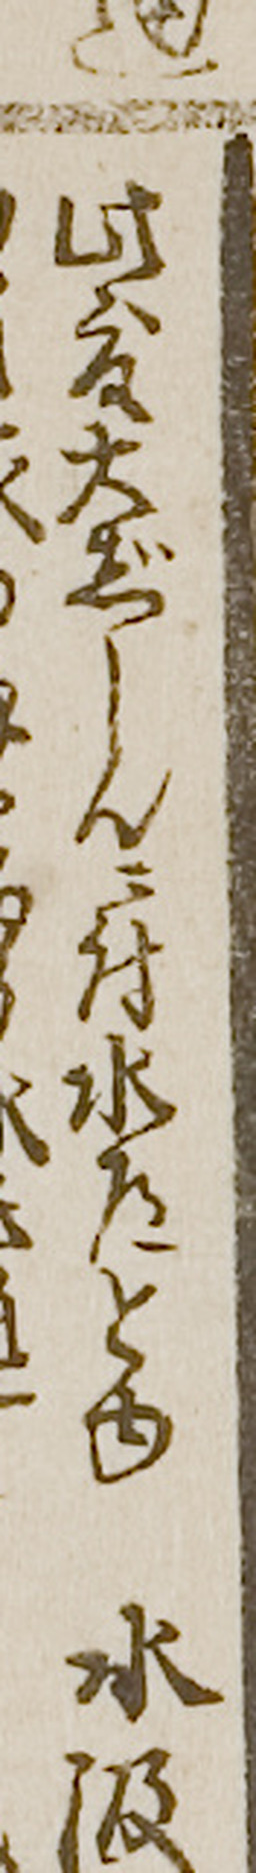此度大じしんに付水道とゆ
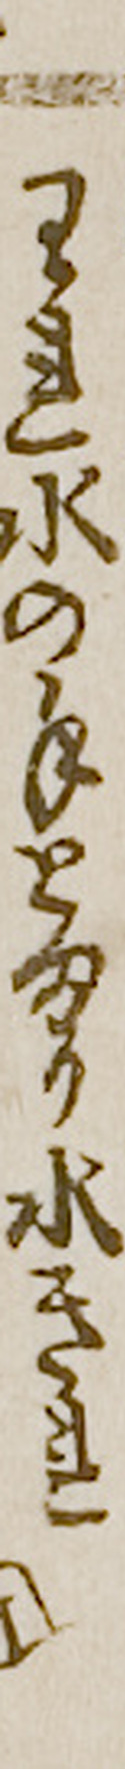われ水の手とまり水きれ
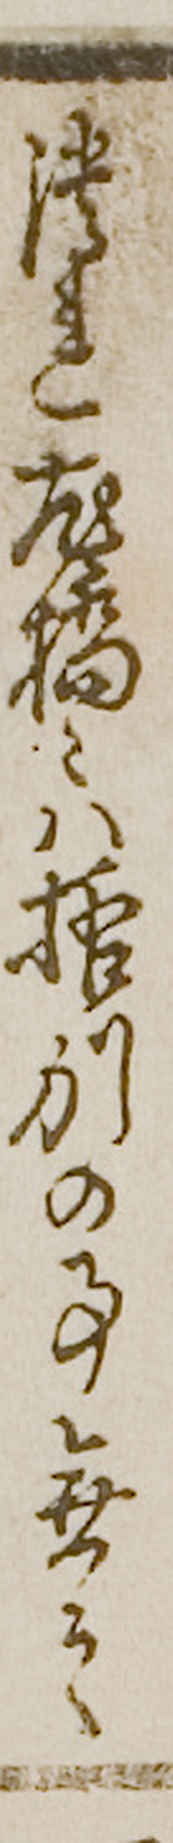潰れ尤橋々は格別の事無之
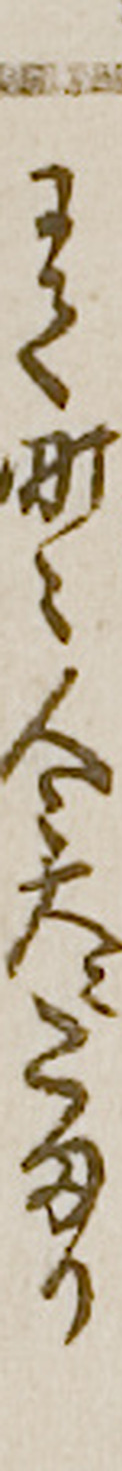にて町々人々大にこまり
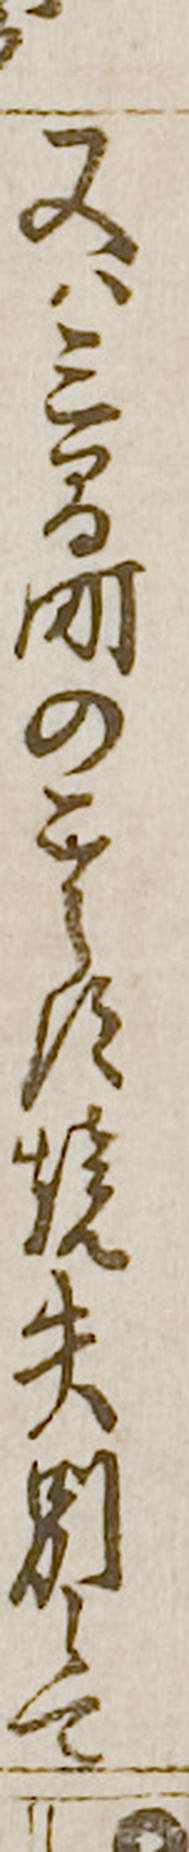又は三間町のこらす焼失別して
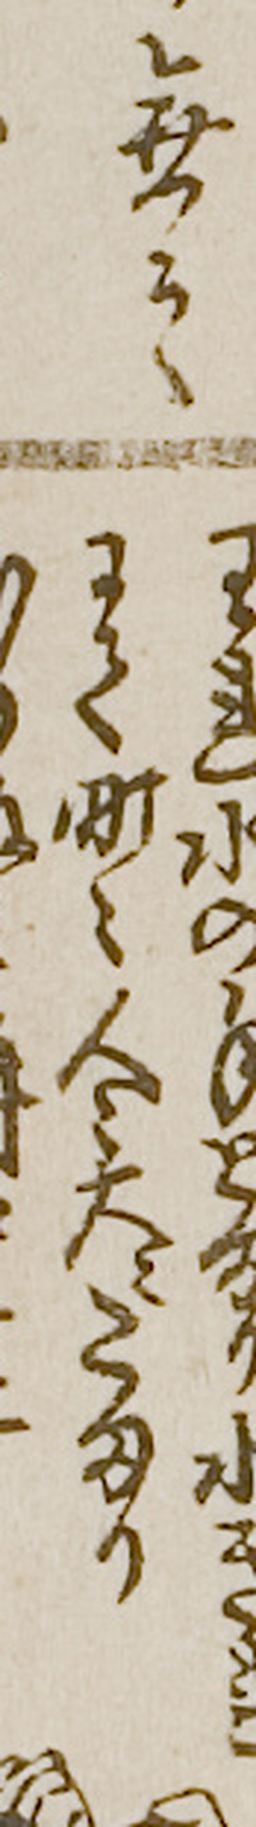にて町々人々大にこまり
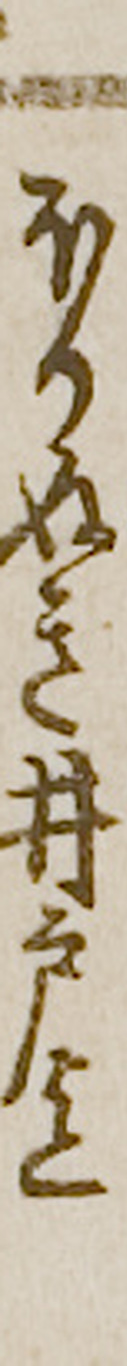ほりぬき井戸迠
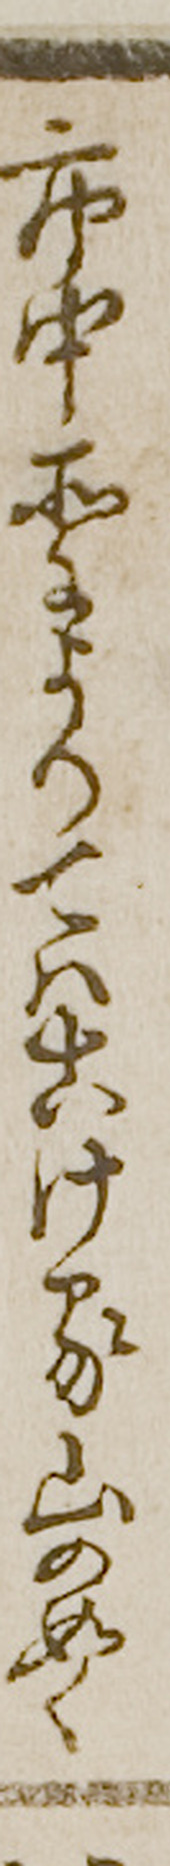市中所によりてはこけ家山の如く
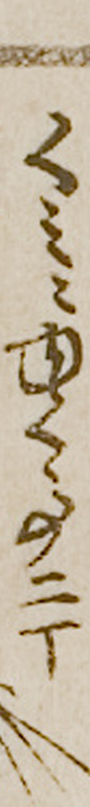くみにゆく事二丁
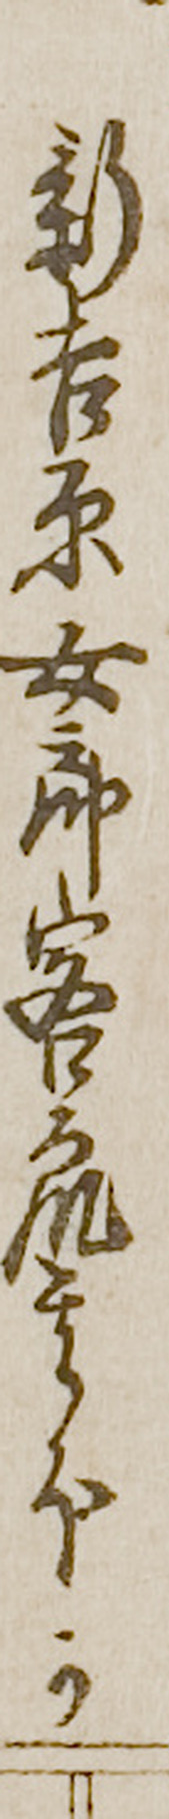新吉原女郎客衆其ほか
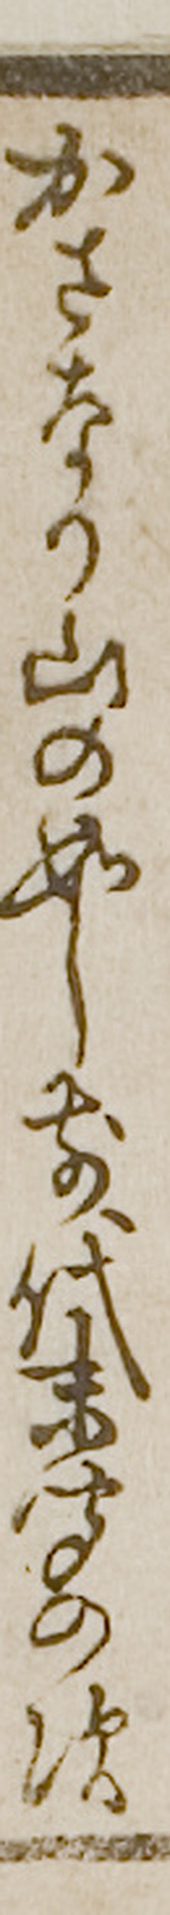かさなり山の如し前代未聞の次
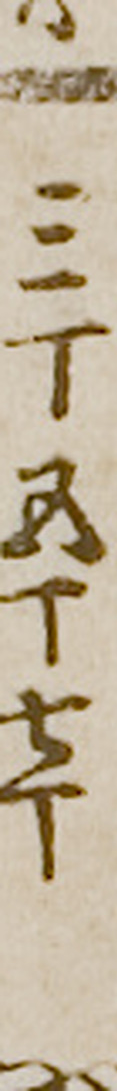三丁五丁七丁
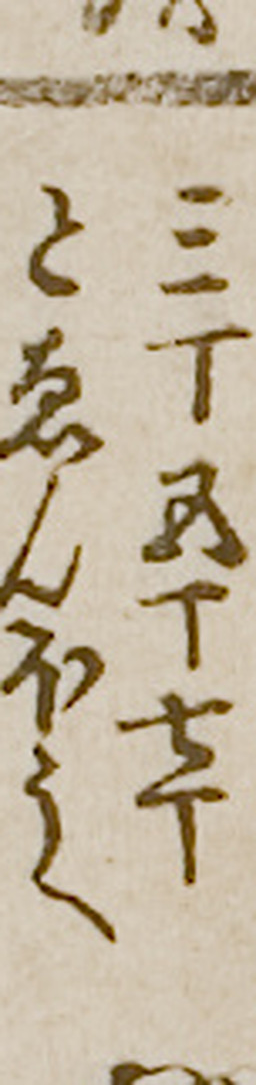とゑんほうへ
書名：東都珍事実録咄
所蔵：東京大学総合図書館 General Library in the University of Tokyo, JAPAN
